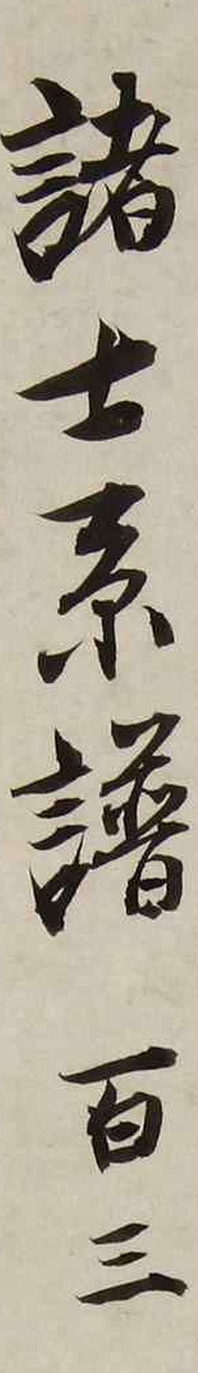諸士系譜百三

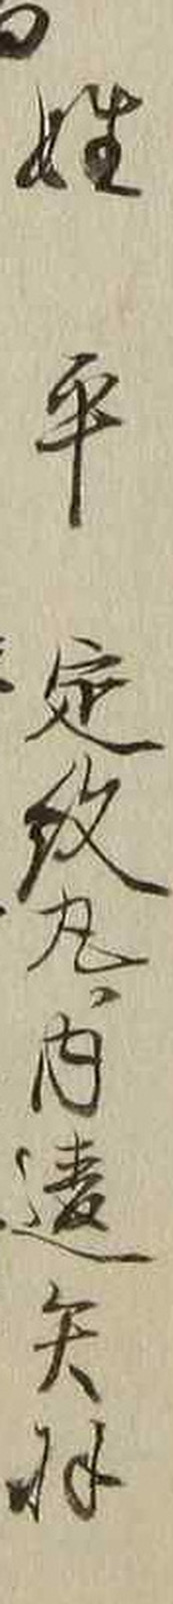姓平定紋丸に内違矢羽
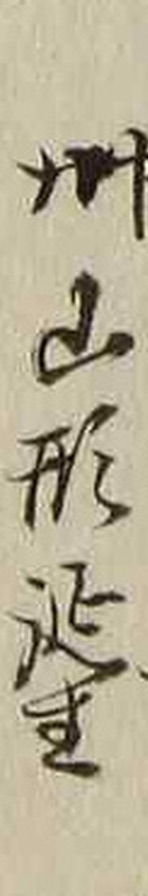州山形誕生
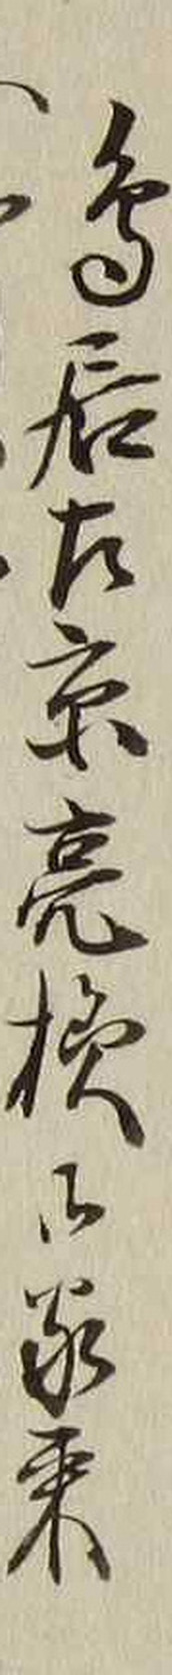鳥居左京亮様御家来
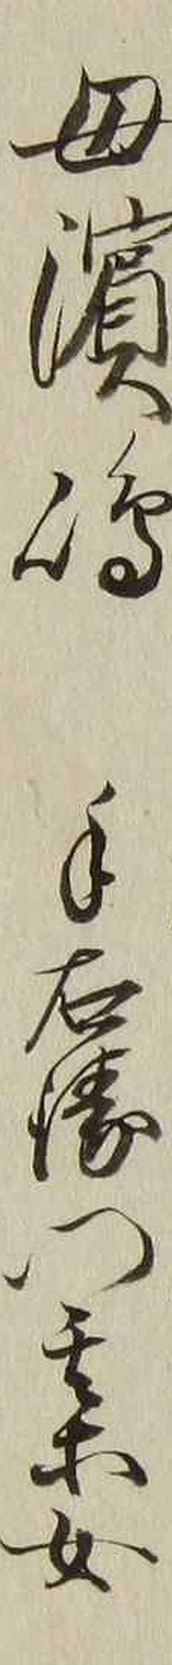母浜嶋手右衛門某女
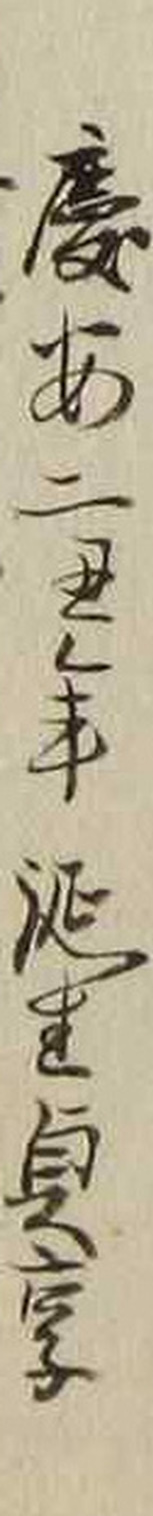慶安二丑年誕生貞享
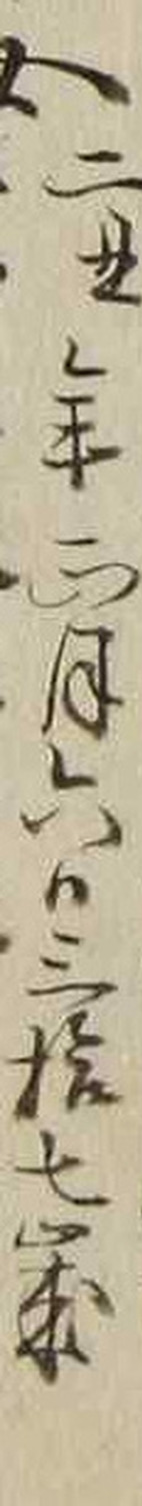二丑年正月六日三拾七歳
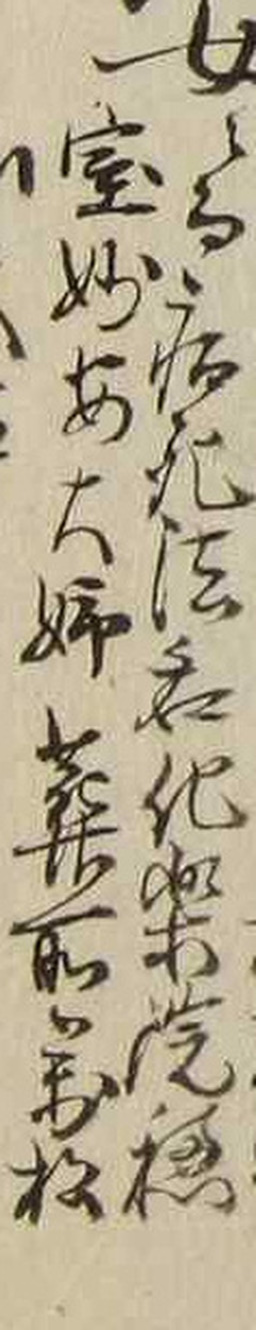室妙安大姉葬所萬松
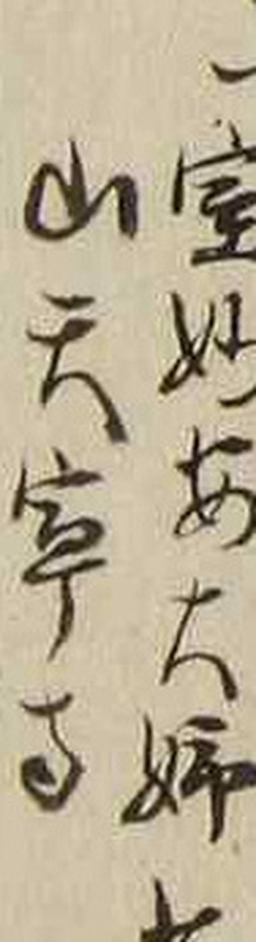山天寧寺
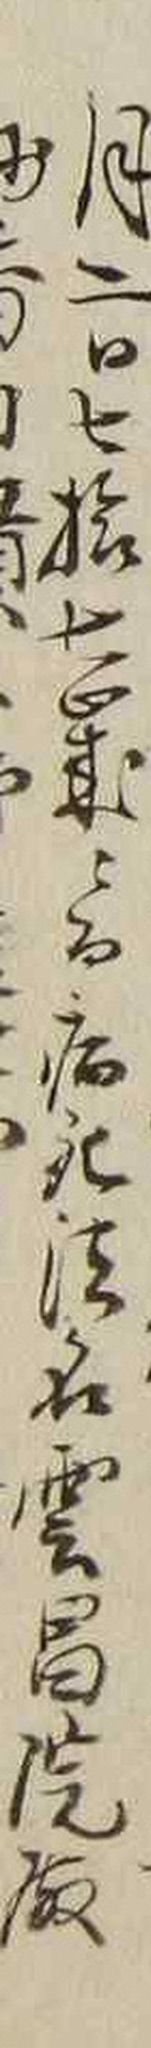月二日七拾七歳に而病死法名雲昌居院殿
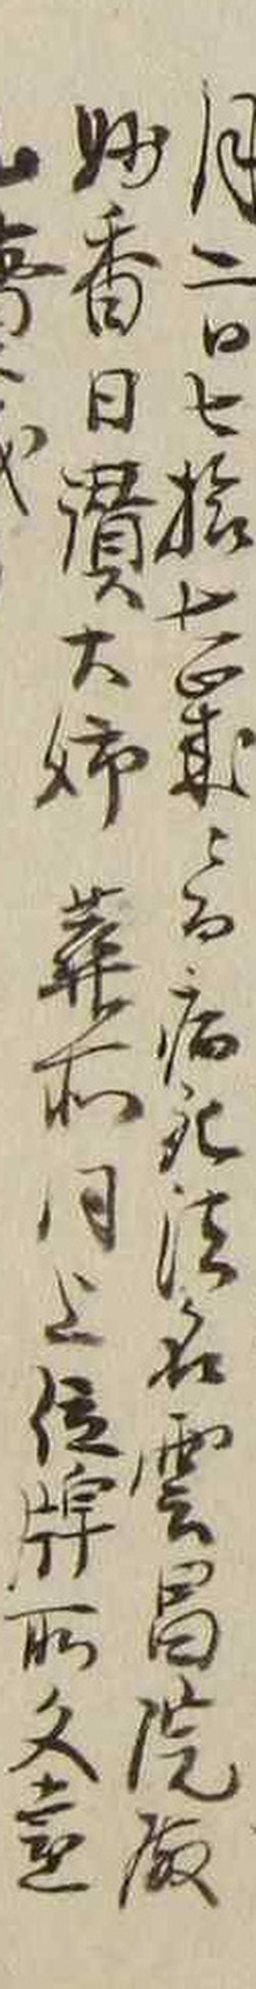妙香日讃大姉葬所同上位牌所久遠
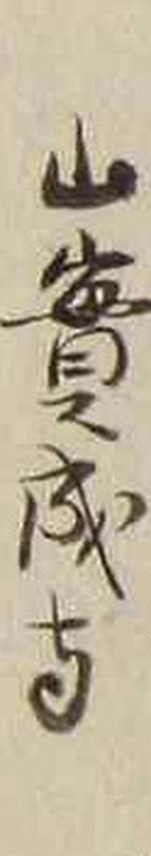山実成寺

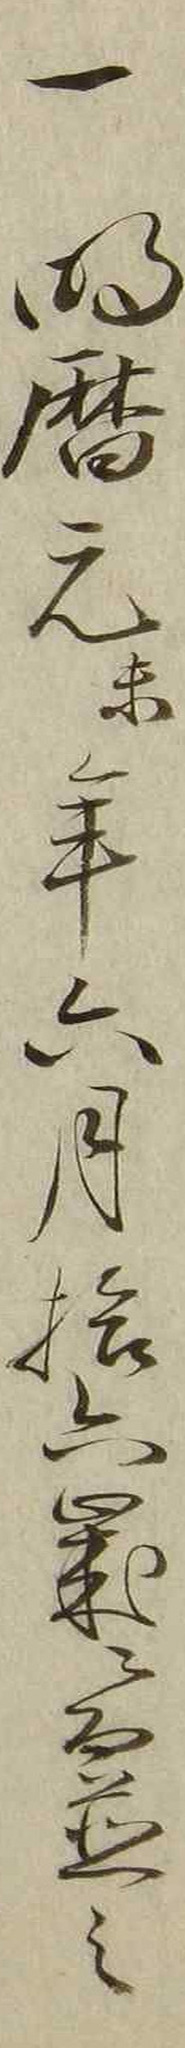一明暦元未年六月拾六歳に而並之
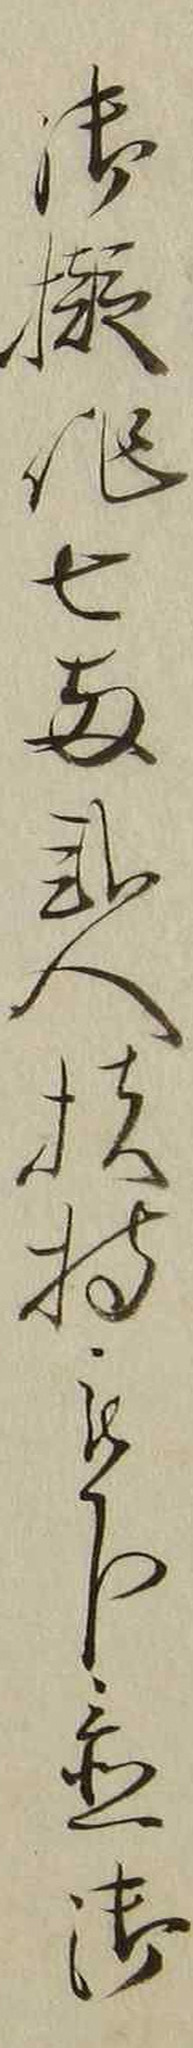御擬作七両弐人扶持被下置御
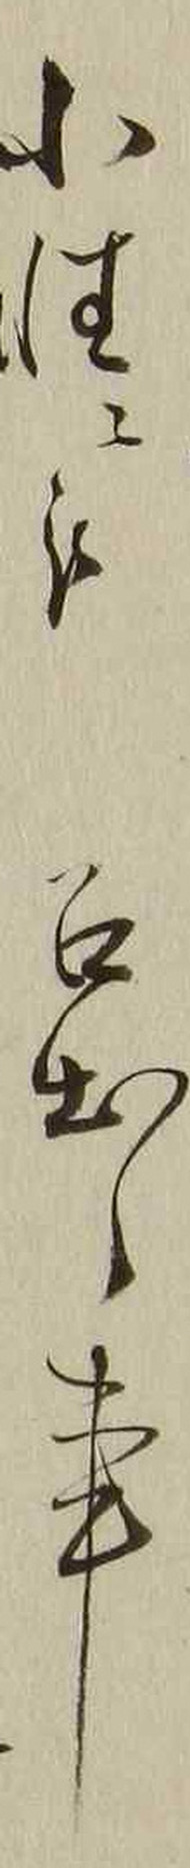小性に被召出候事
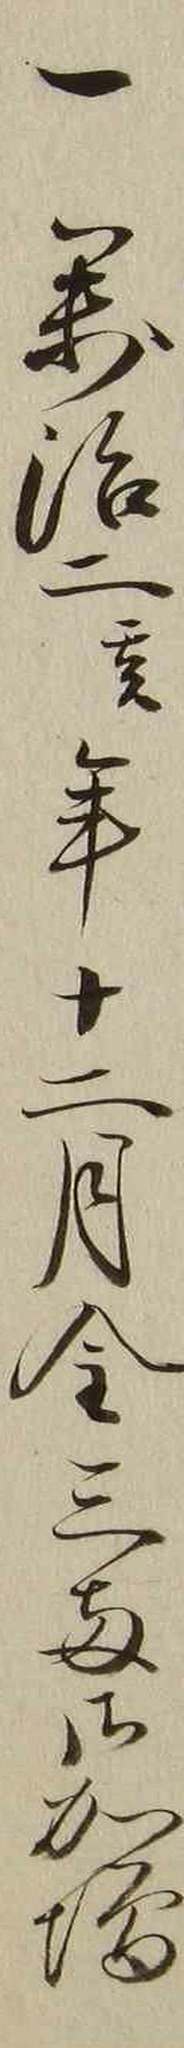一万治二亥年十二月金三両御加増
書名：諸士系譜　巻之103　か之部11
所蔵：会津若松市立会津図書館
